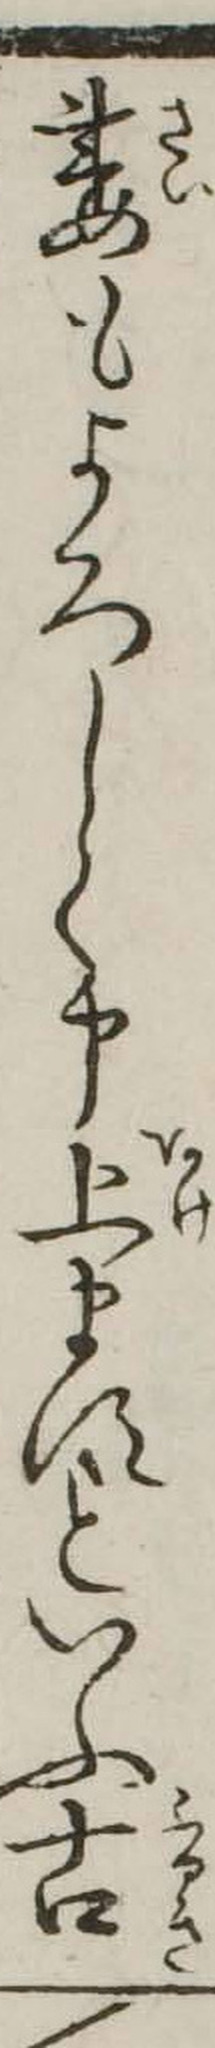妻もよろしく申上ますといふ古
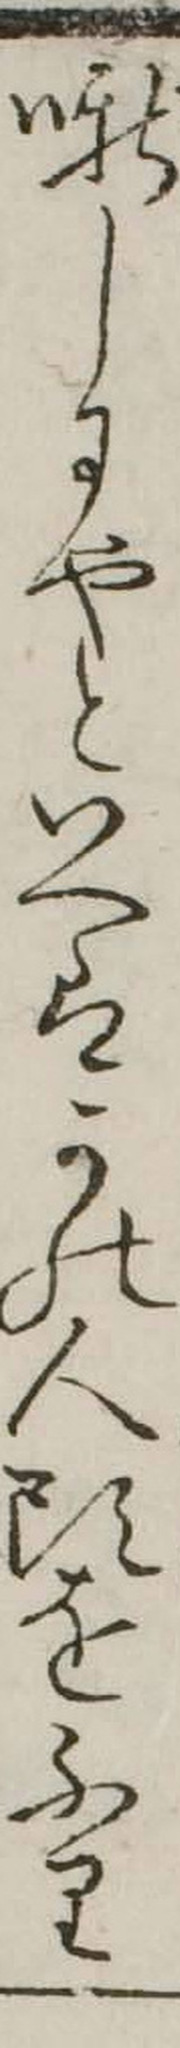噺しにやといへはかの人頭をふり
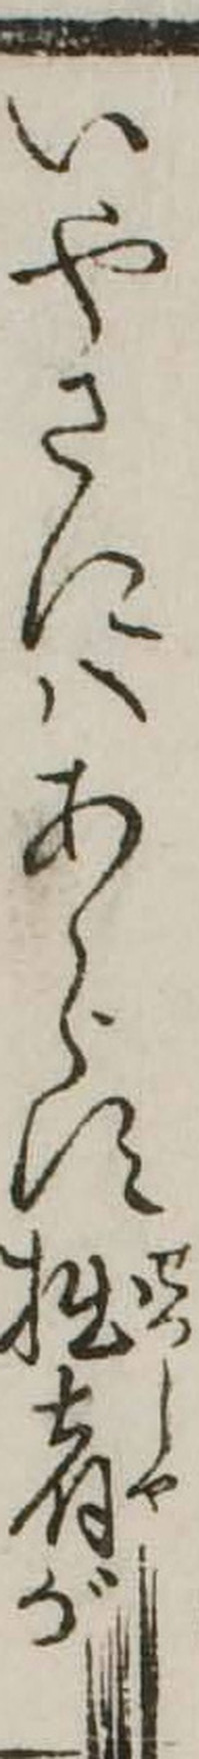いやさにはあらす拙者が
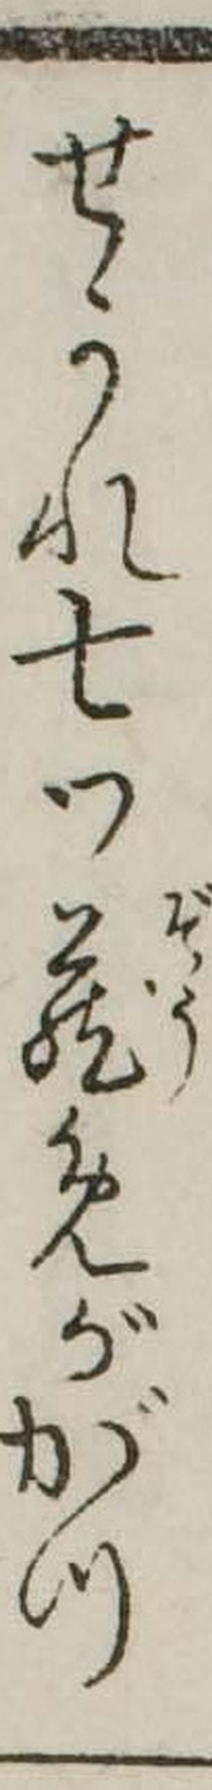せかれ七ッ蔵めががつ
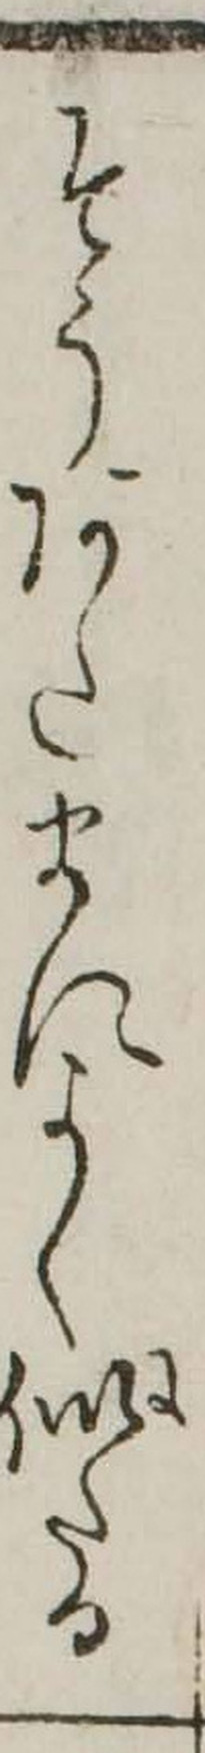そうあたまによく似たる
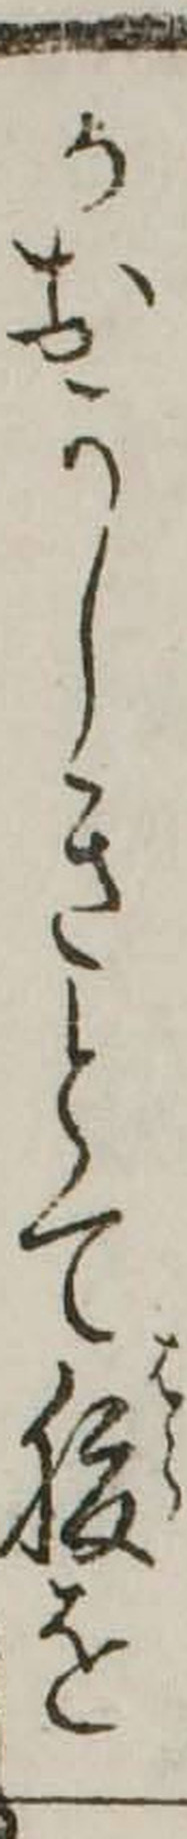かおかしきとて腹を
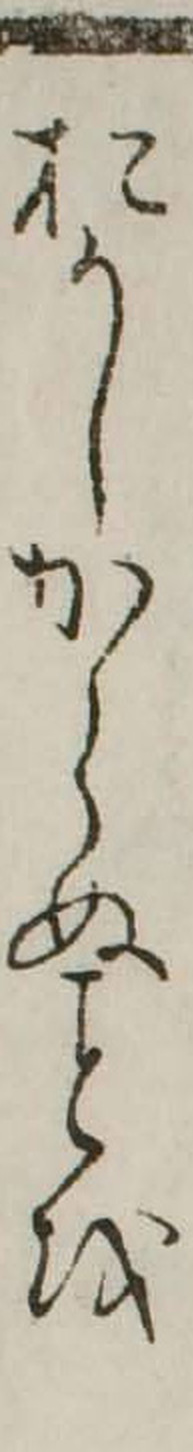おかしからぬことを
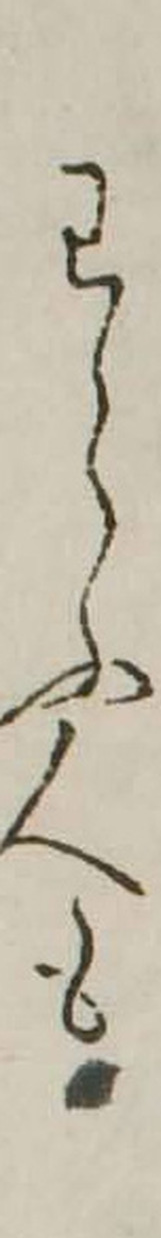わらふ人も

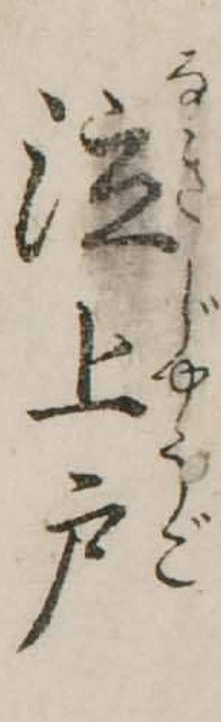泣上戸
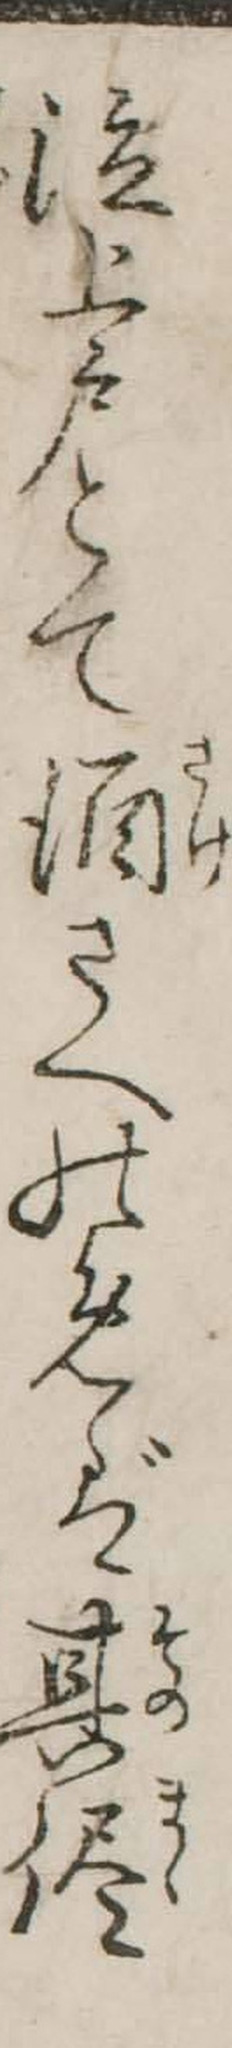泣上戸とて酒さへのめば其侭
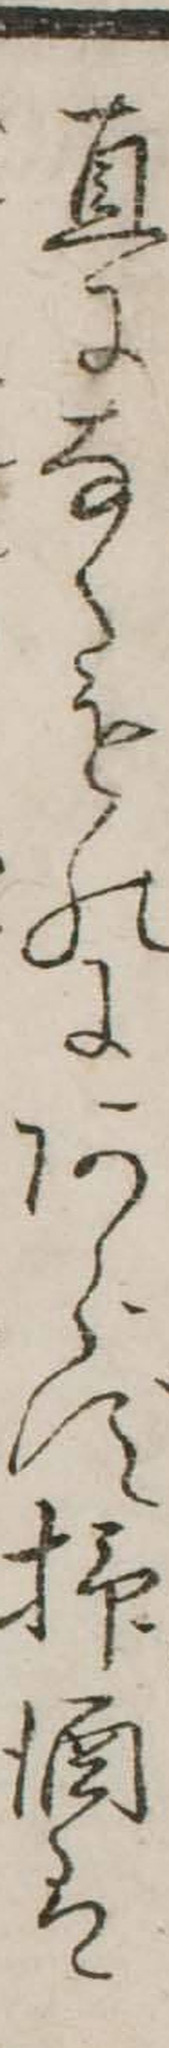直になくものにあらず抑酒は
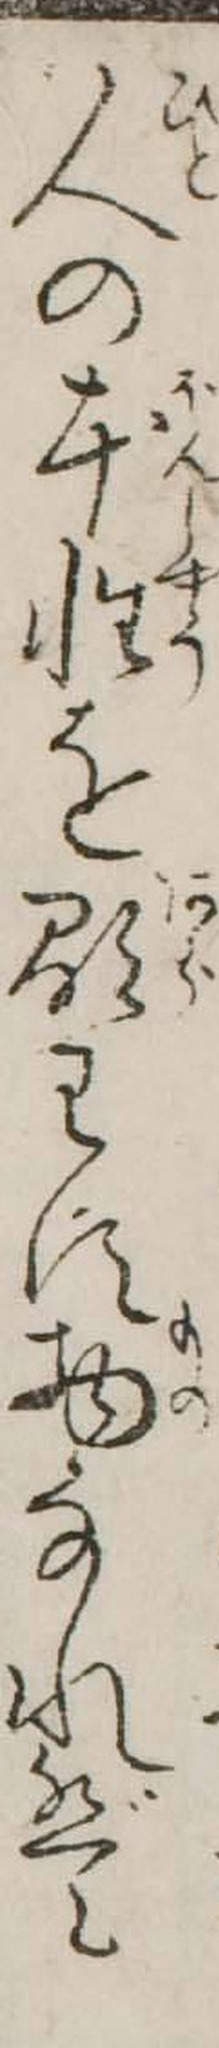人の本性を顕わす物なれば
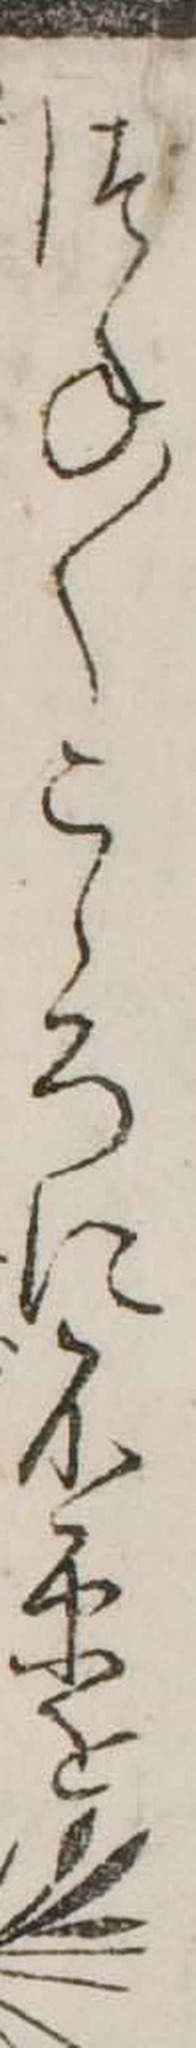つね〳〵こゝろに不平を
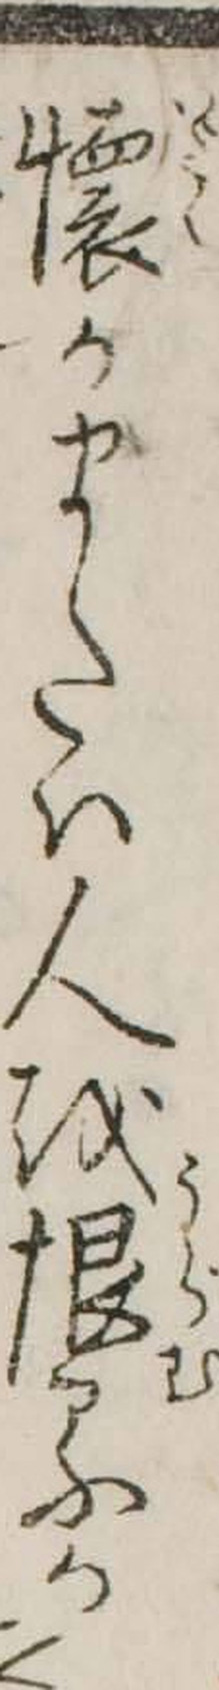懐かまたは人を恨るか
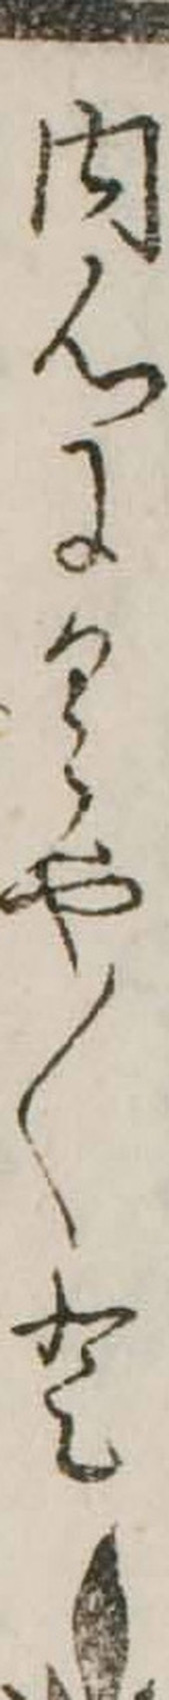内心にくや〳〵と
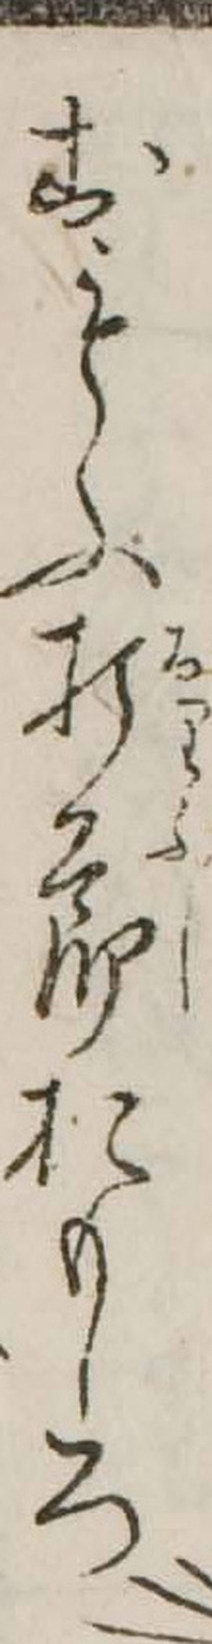おもふ折節おもしろ
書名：繪本不盡泉
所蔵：国文学研究資料館
